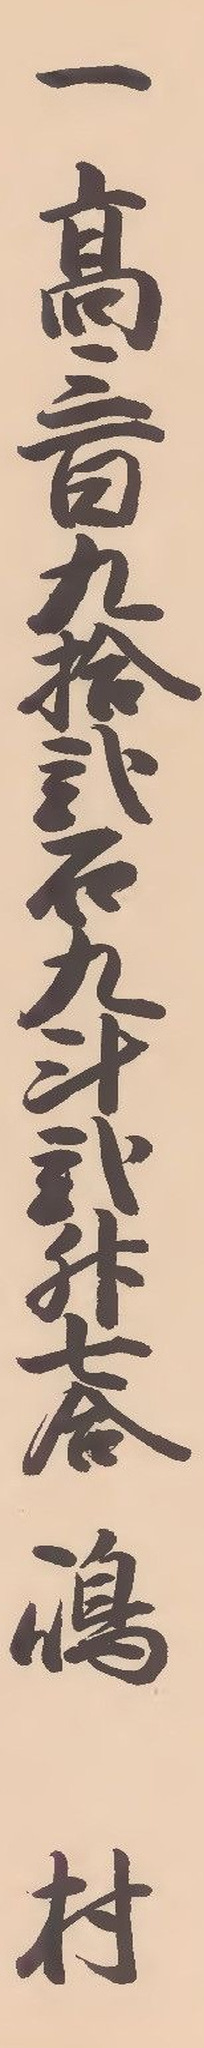一高三百九拾弐石九斗弐升七合島村
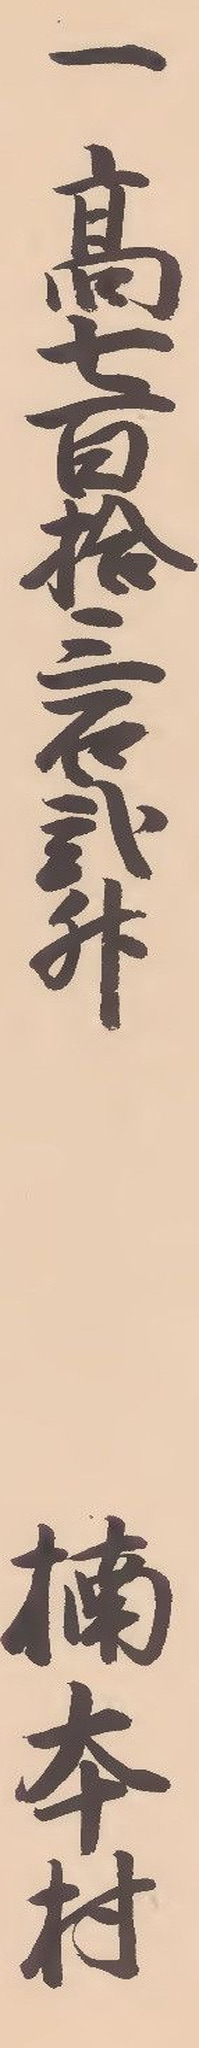一高七百拾三石弐升楠本村
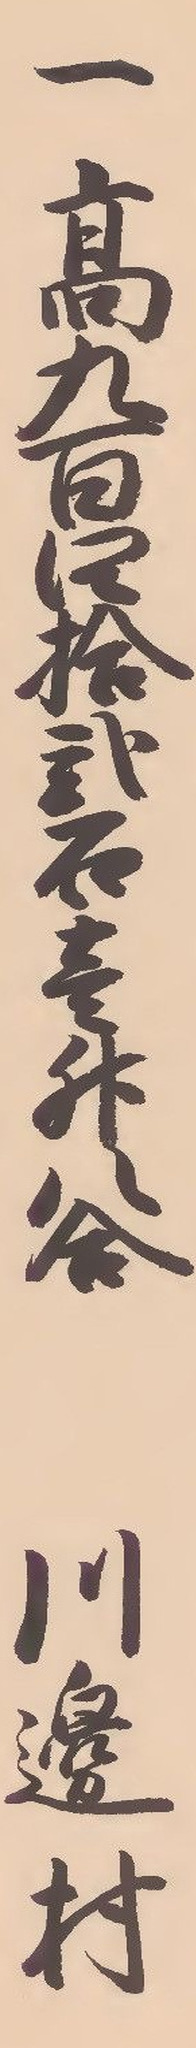一高九百四拾弐石壱升八合川辺村

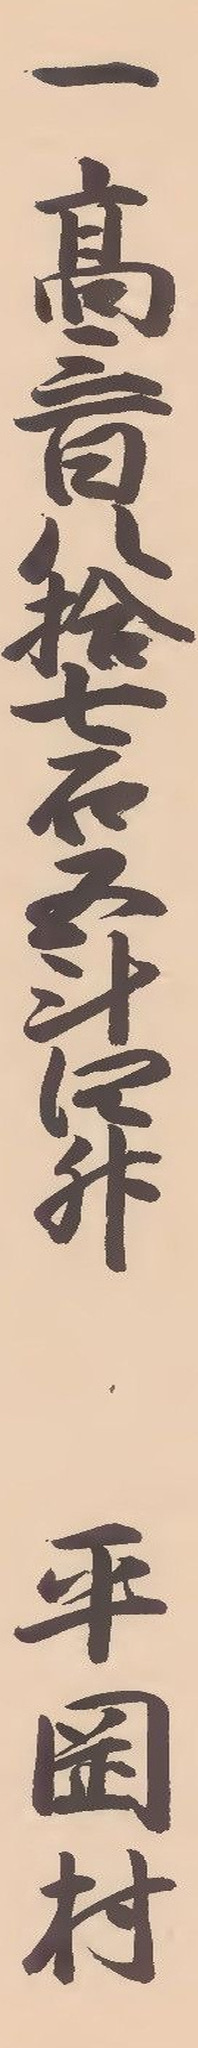一高三百八拾七石五斗四升平岡村
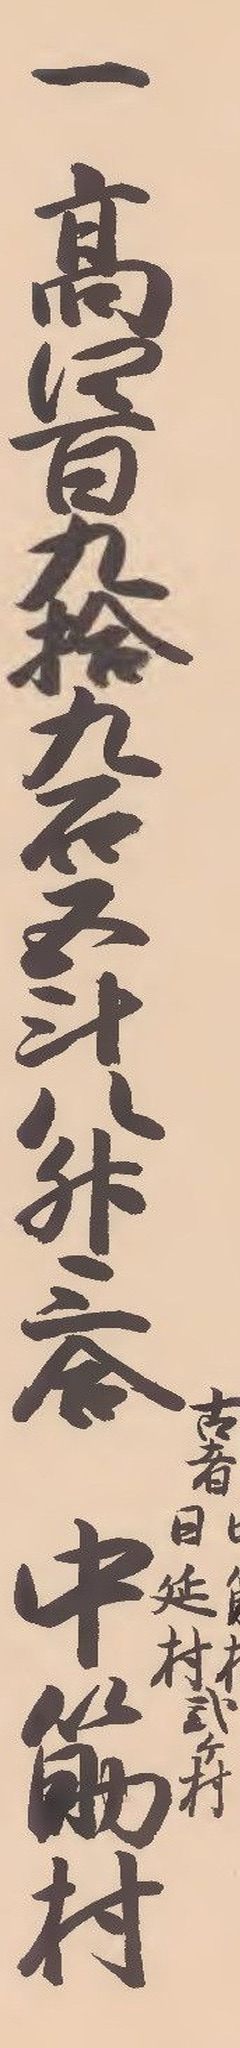一高四百九拾三石四斗七升弐合谷村
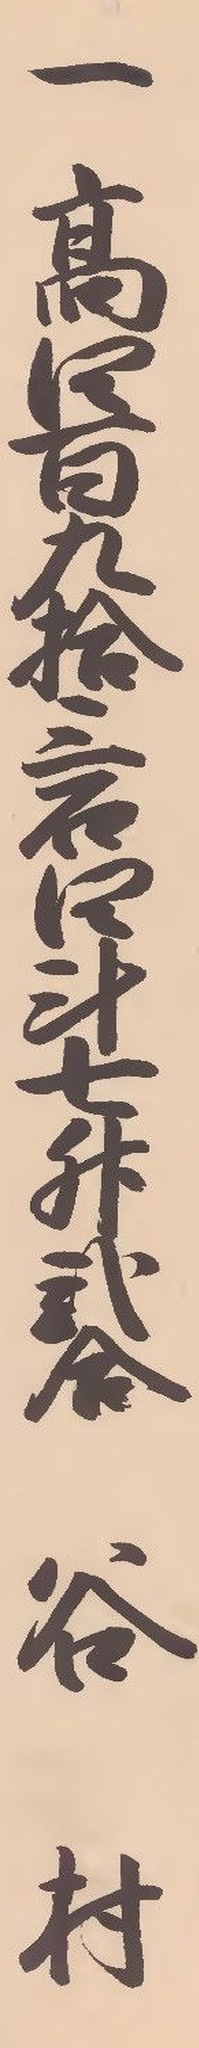一高四百九拾三石四斗七升弐合谷村
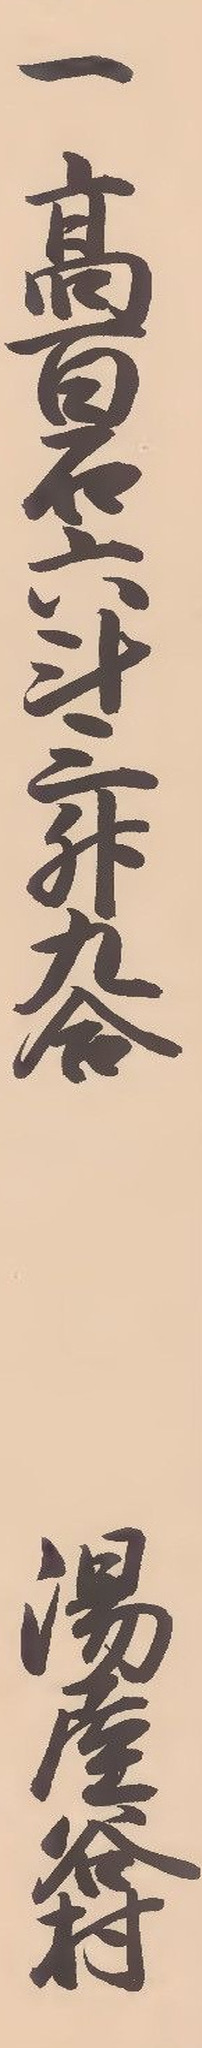一高百石六斗三升九合湯屋谷村
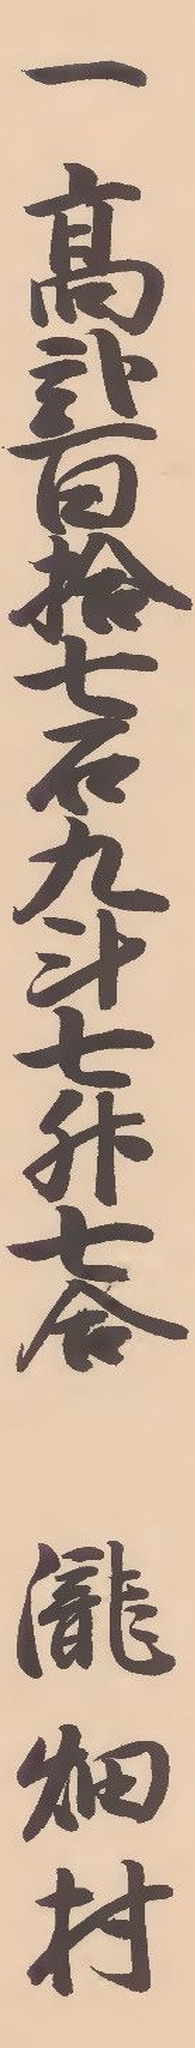一高弐百拾七石九斗七升七合滝畑村
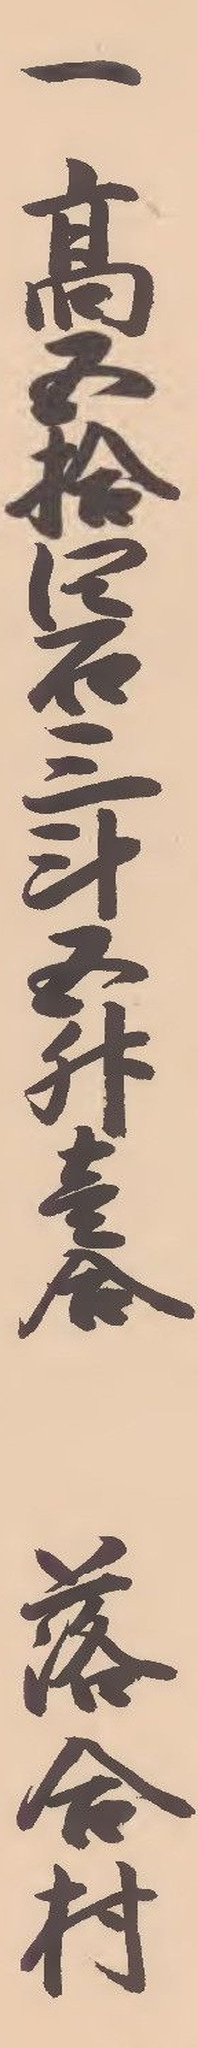一高五拾四石三斗五升壱合落合村
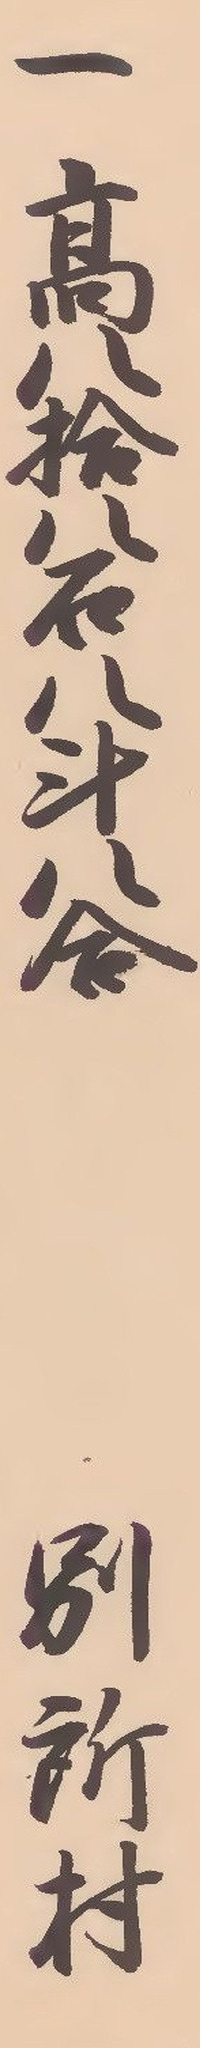一高八拾八石八斗八合別所村

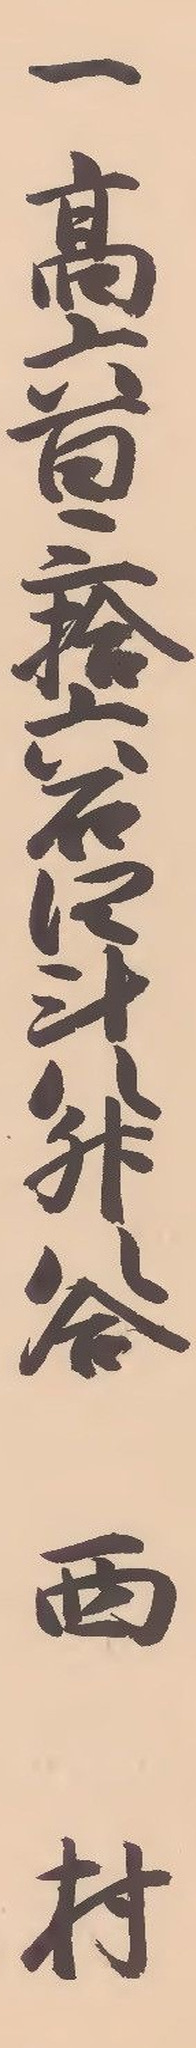一高六百三拾六石四斗八升八合西村
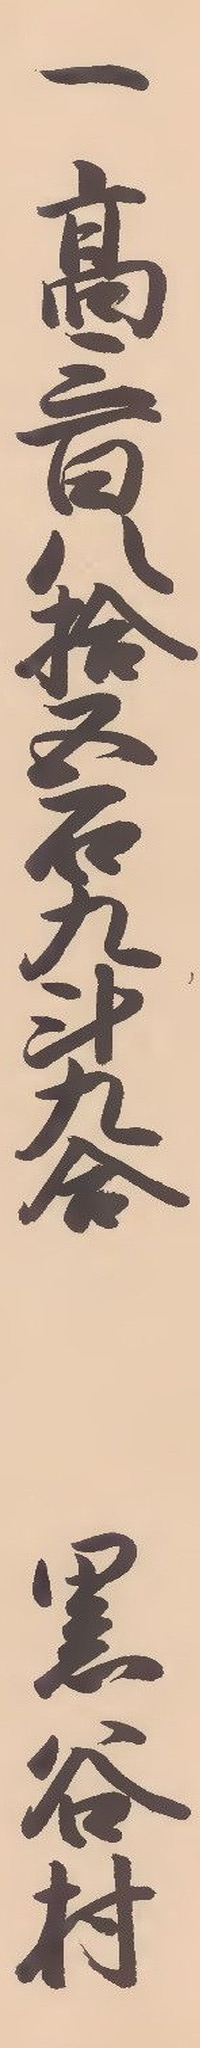一高三百八拾五石九斗九合黒谷村
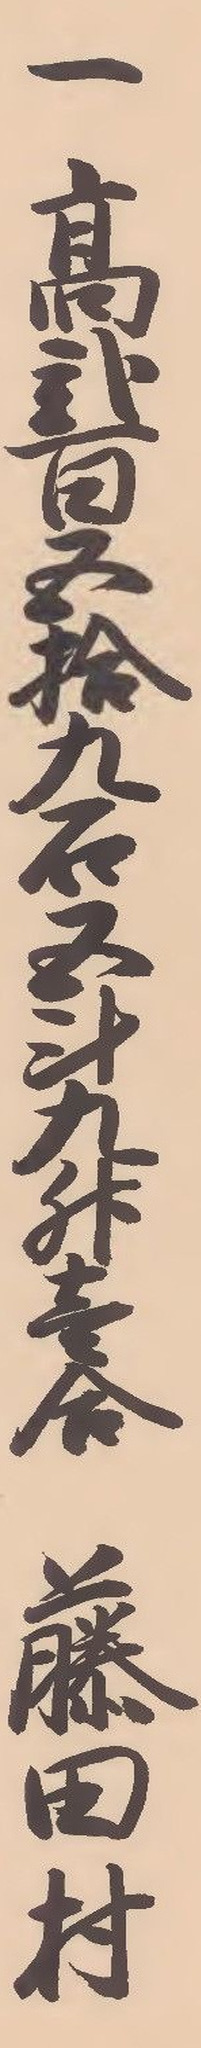一高弐百五拾九石五斗九升壱合藤田村
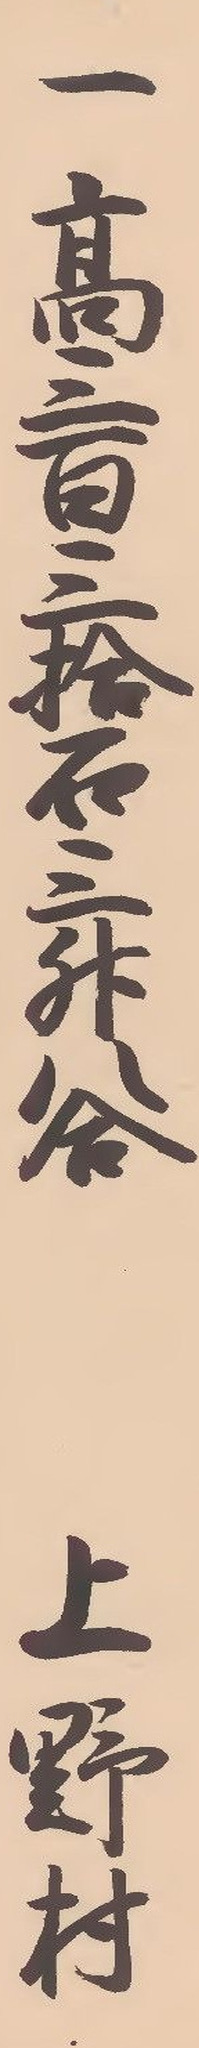一高三百三拾石三升八合上野村
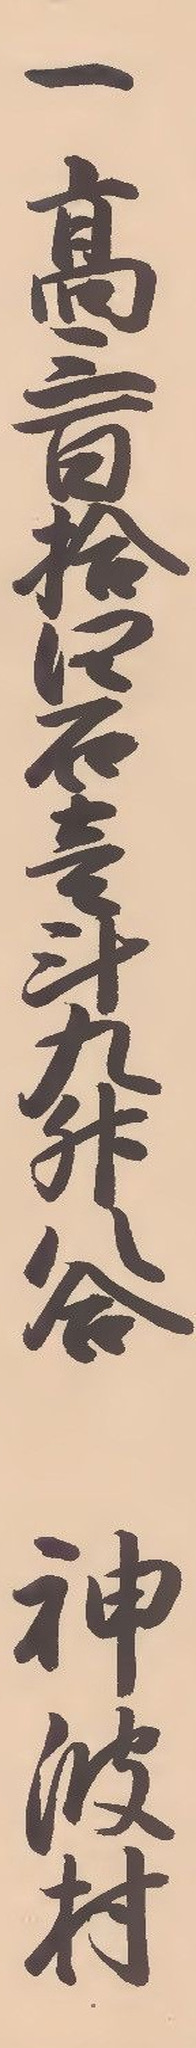一高三百拾四石壱斗九升八合神波村
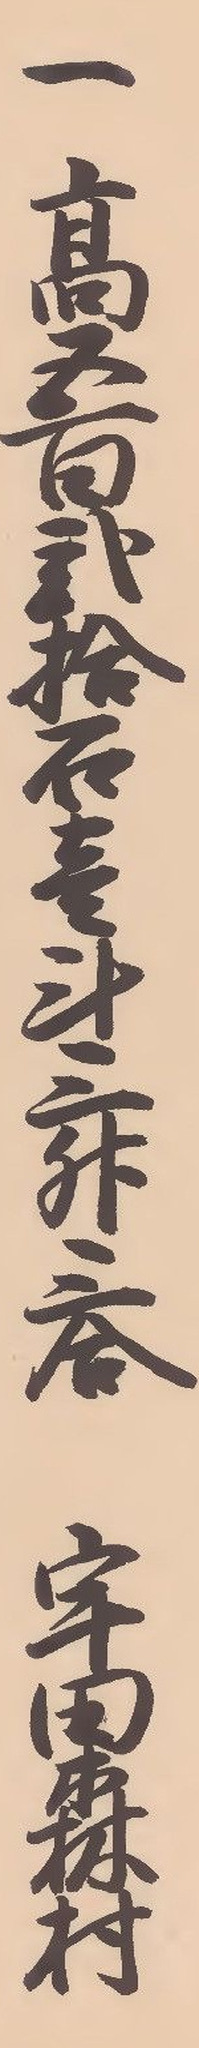一高五百弐拾石壱斗三升三合宇田森村
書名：紀伊国郷帳
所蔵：国立公文書館 National Archives of Japan
